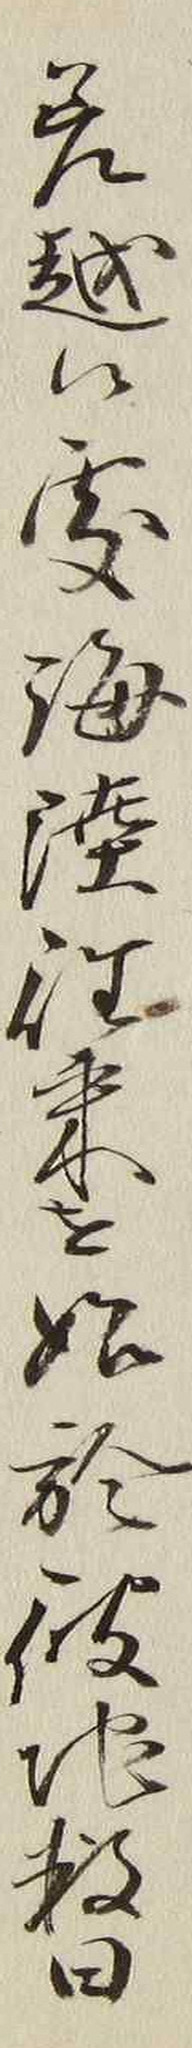差越候処海陸往来を始於彼地数日
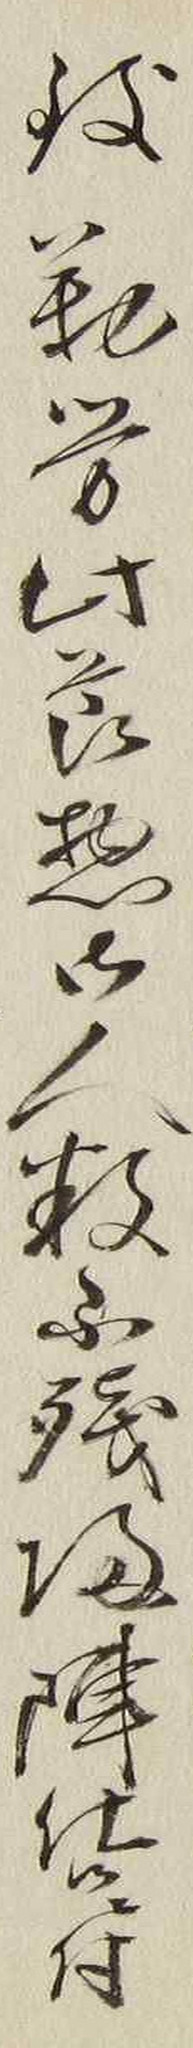致勤労此節惣御人数不残帰陣仕候ニ付
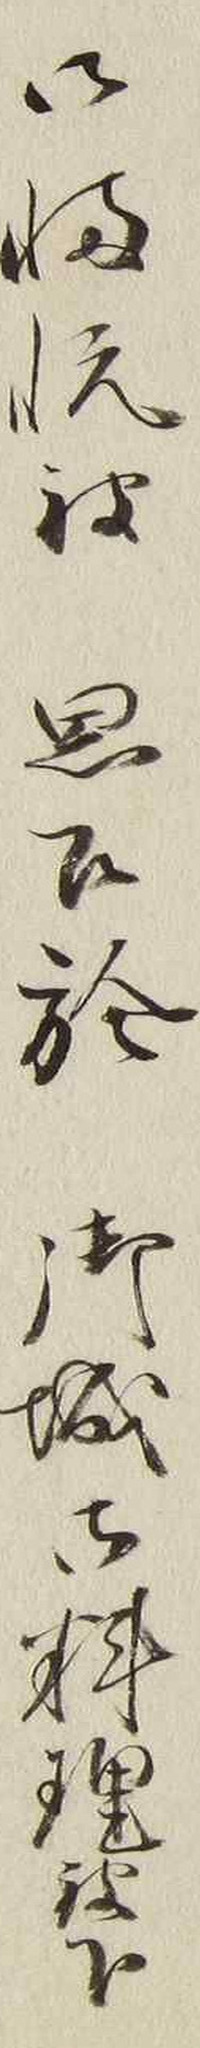御悦被思召於御城御料理被下
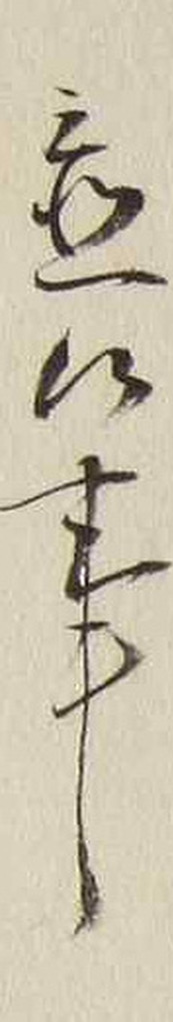置候事

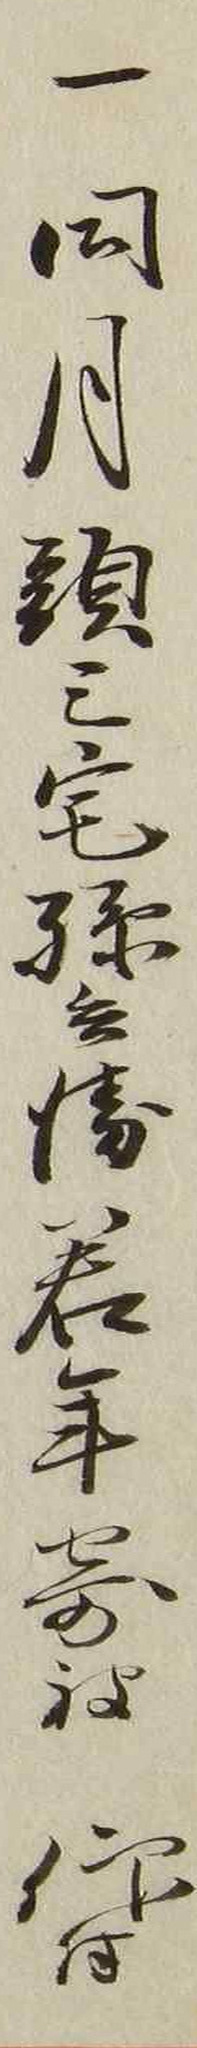一同月頭三宅孫兵衛若年寄被仰付
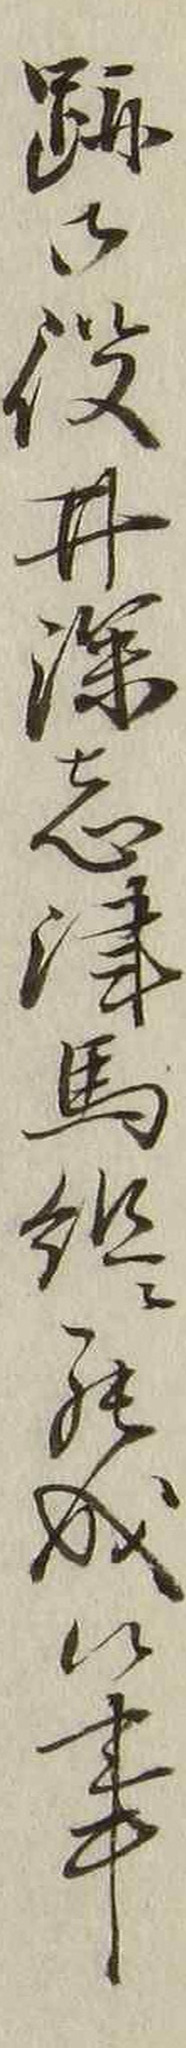跡御役井深志津馬組ニ罷成候事
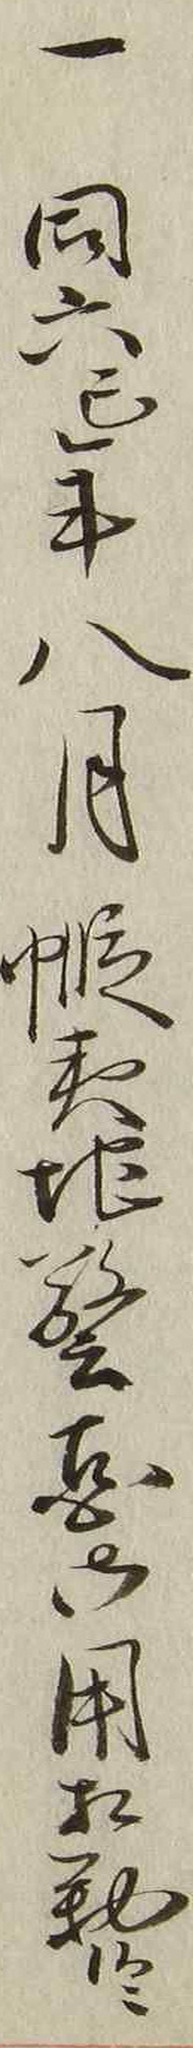一同六巳年八月蝦夷地警固御用相勤候ニ
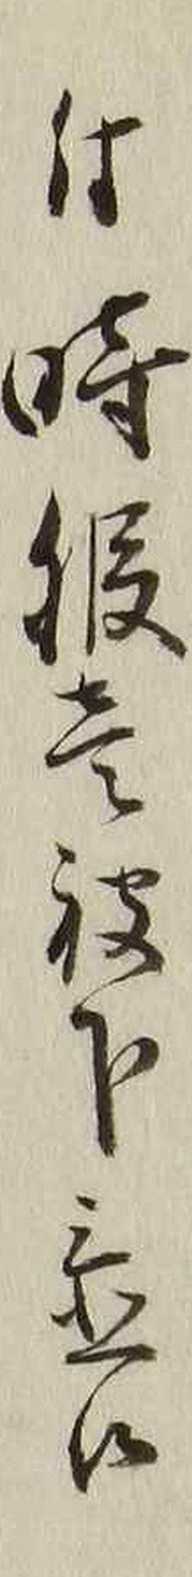付時服壱被下置候
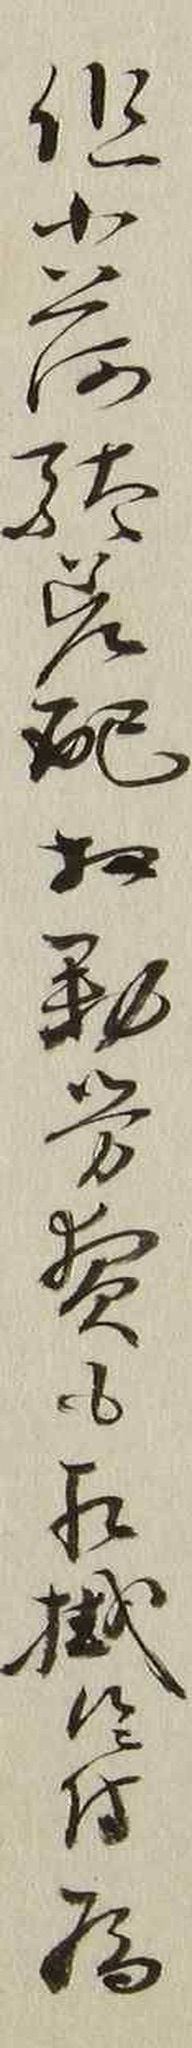但小荷駄差配相勤労費も相掛候ニ付為
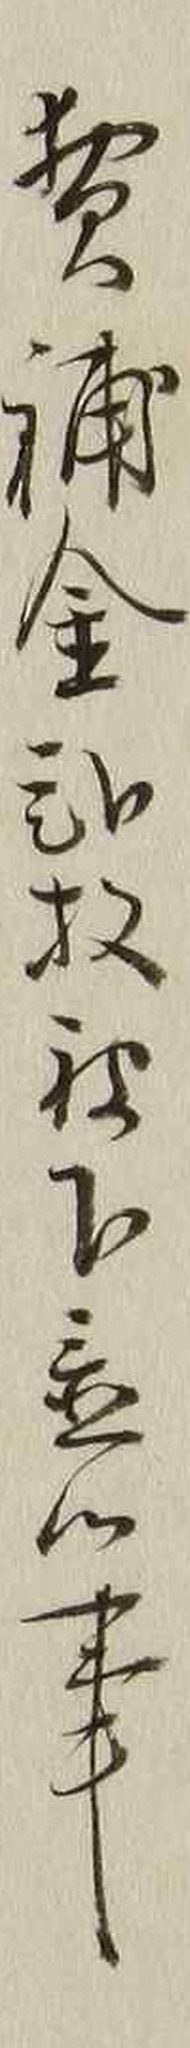費補金弐枚被下置候事
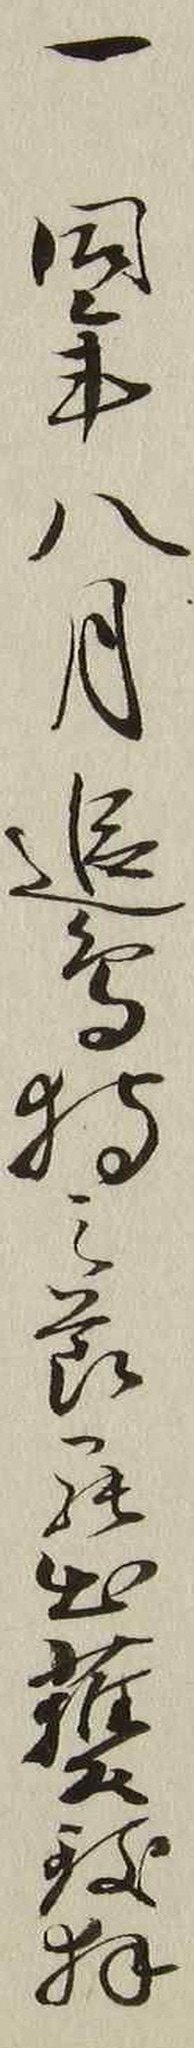一同年八月追鳥狩之節罷出獲致拝
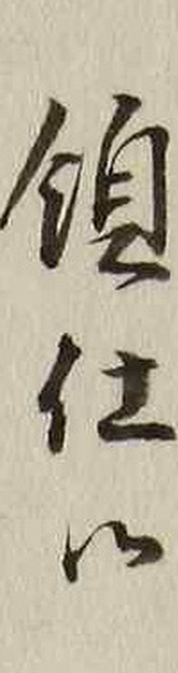領仕候
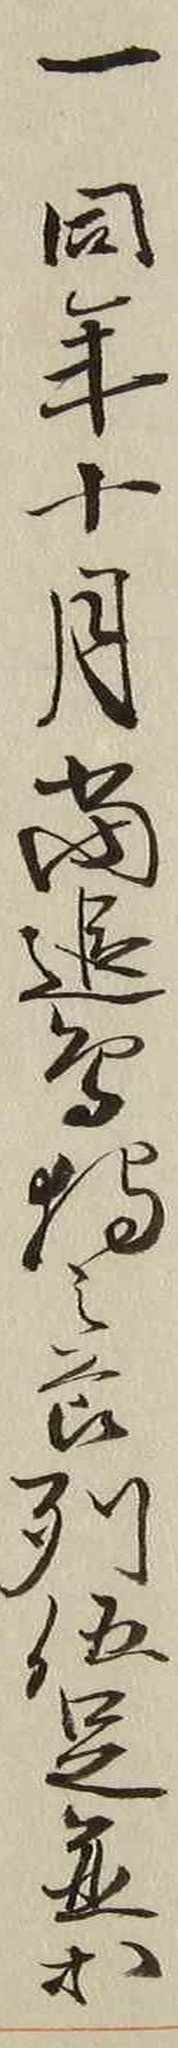一同年十月当追鳥狩之節列伍足並等
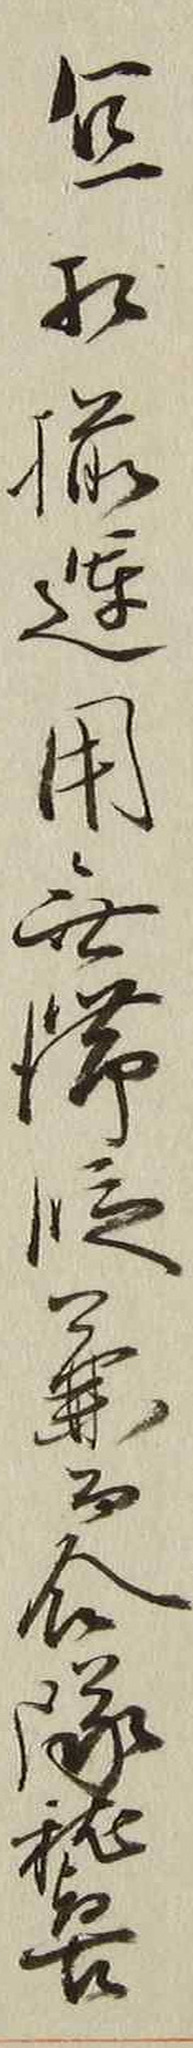宜相揃運用無滞段兼而合隊稽古
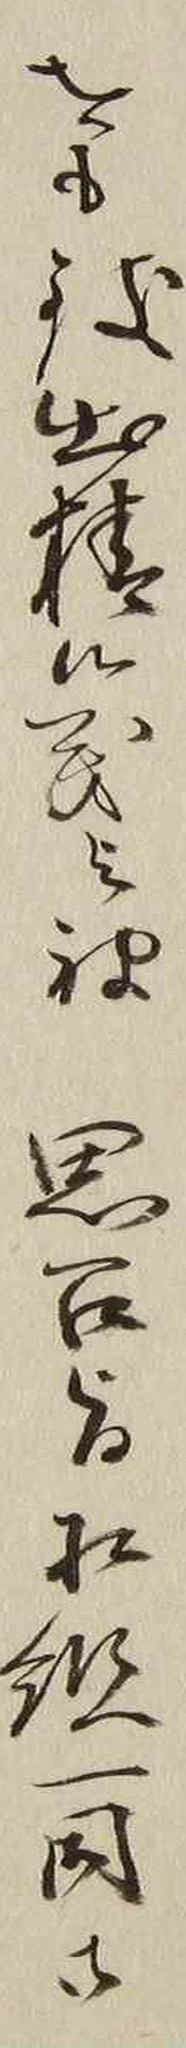をも致出精候義と被思召旨相組一同御
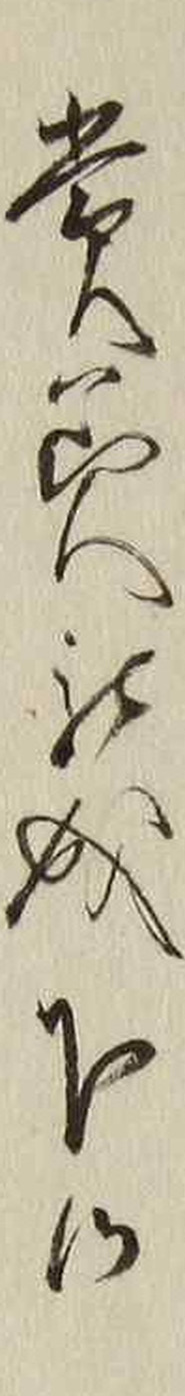賞美被成下候
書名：諸士系譜　巻之163　な之部5
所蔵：会津若松市立会津図書館
